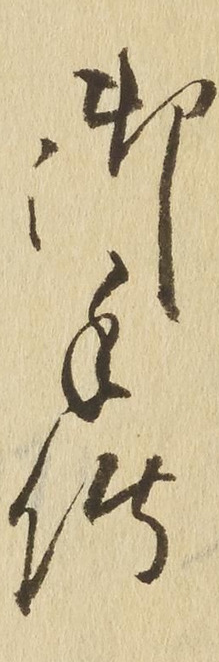御手伝
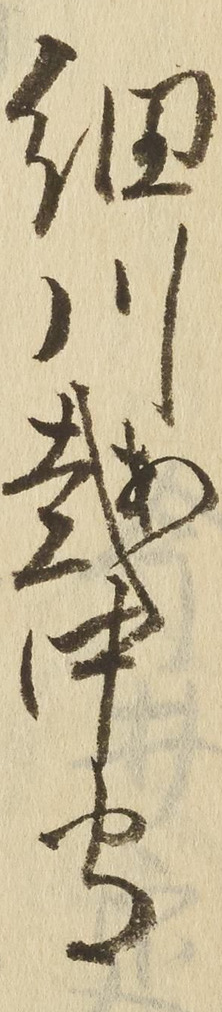細川越中守
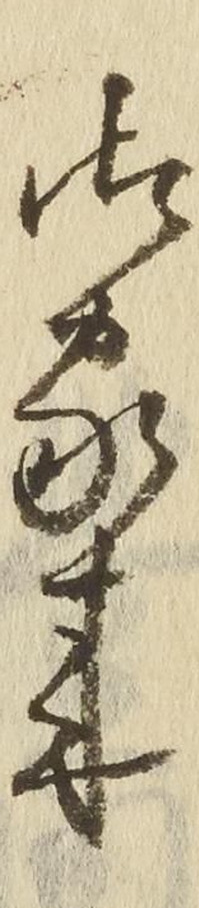御家来
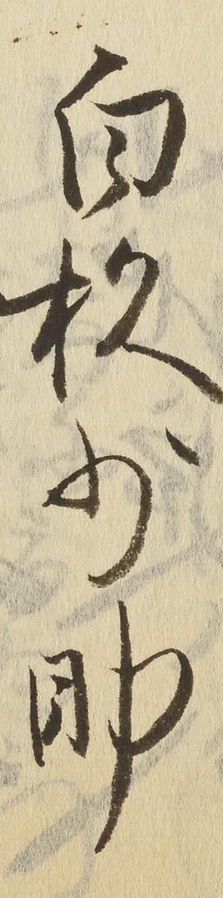白杉少助
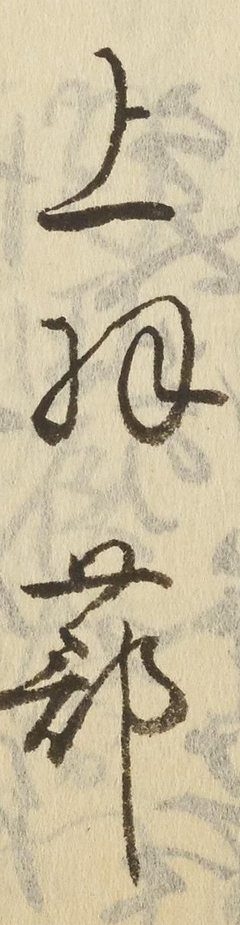上羽蔀
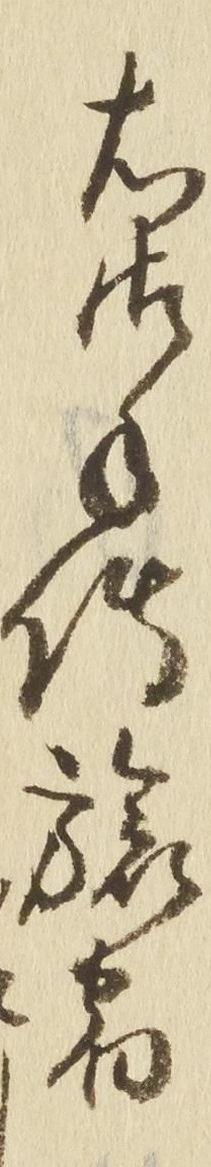右御手伝旅宿
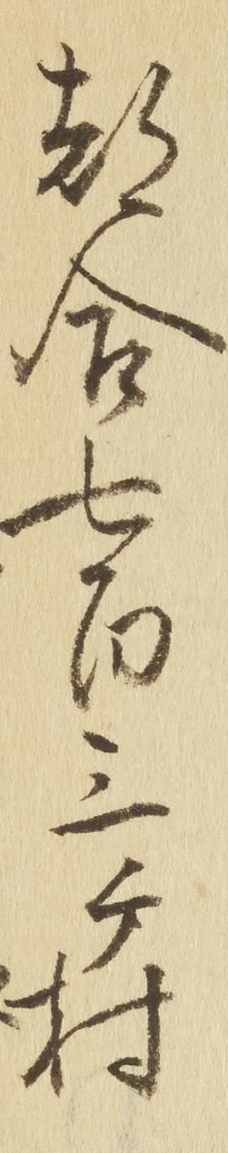都合七百三ヶ村
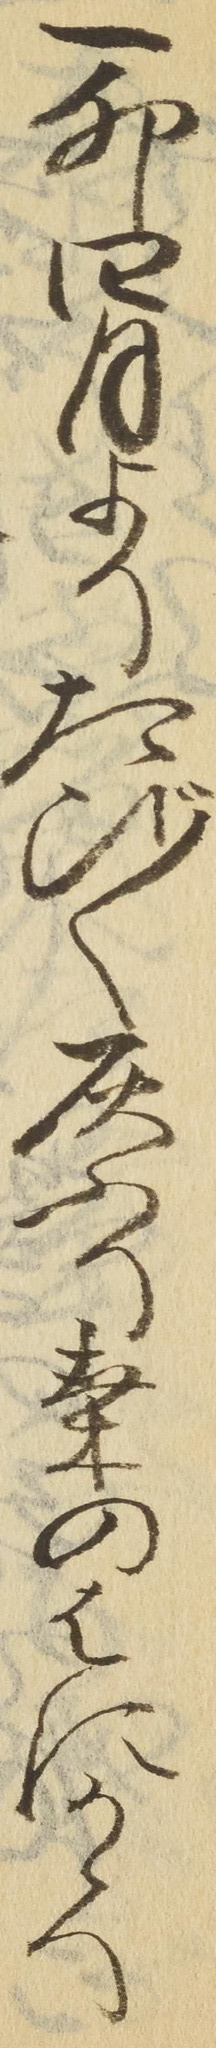一卯四月より度々たび〳〵砂ふり桑の葉にかゝり
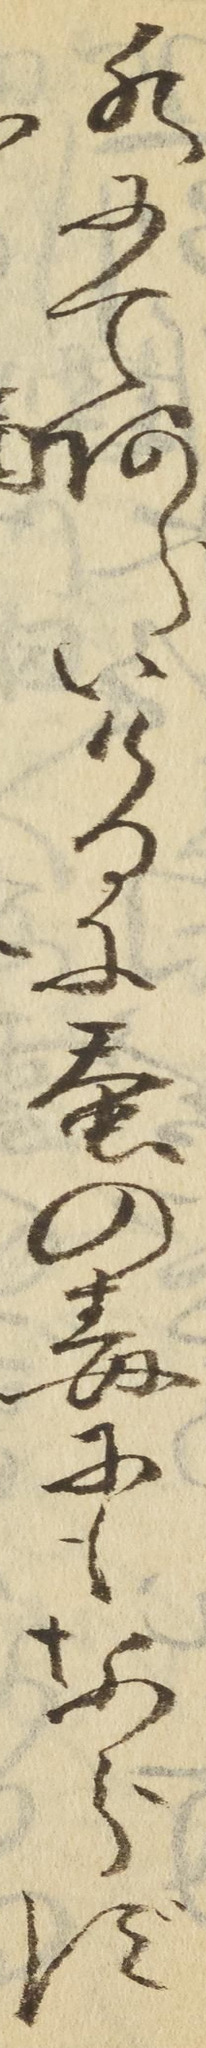水にてあらいけるに蚕の毒にもならす
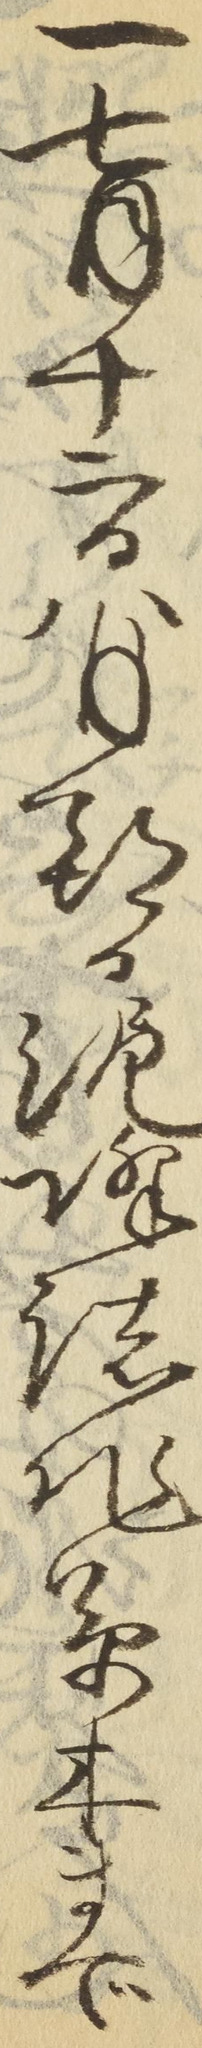一七月十二日八月朔日泥降諸作草木まで
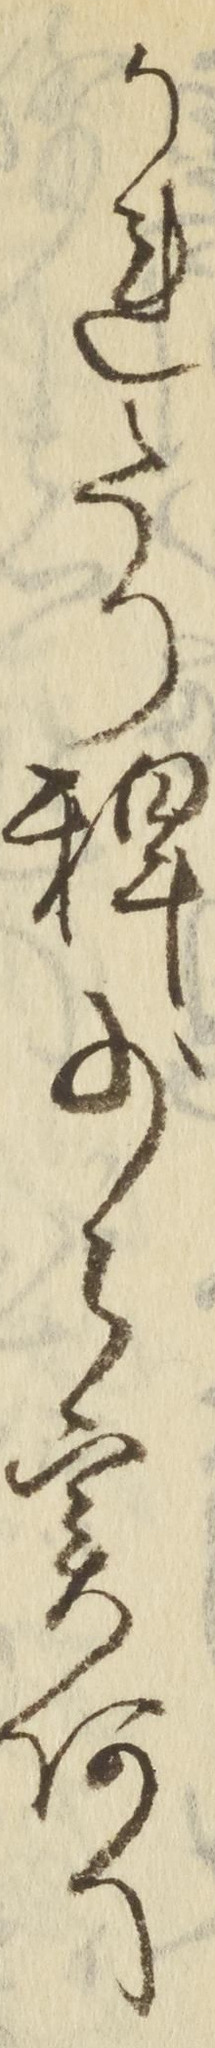かれたり稗少々実あり
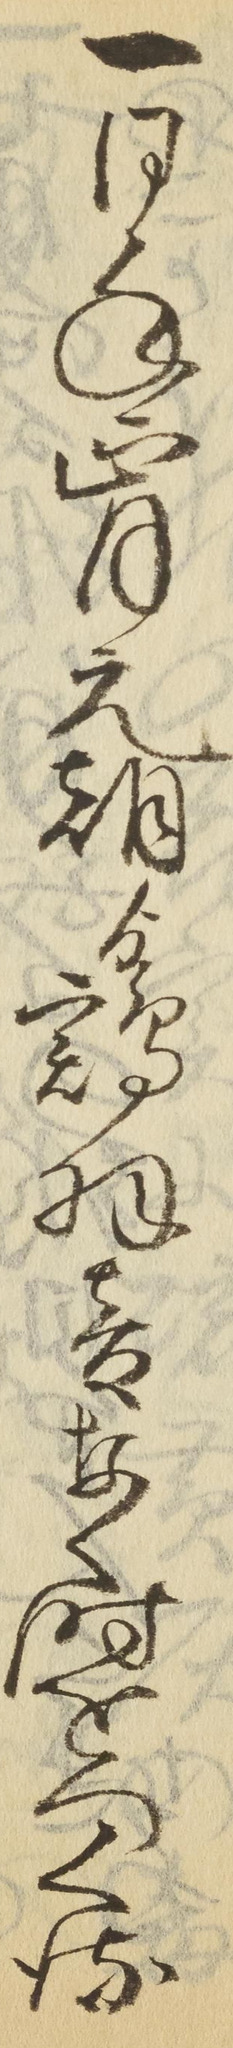一同年正月元朝ゟ鶏羽音なく時をつくる
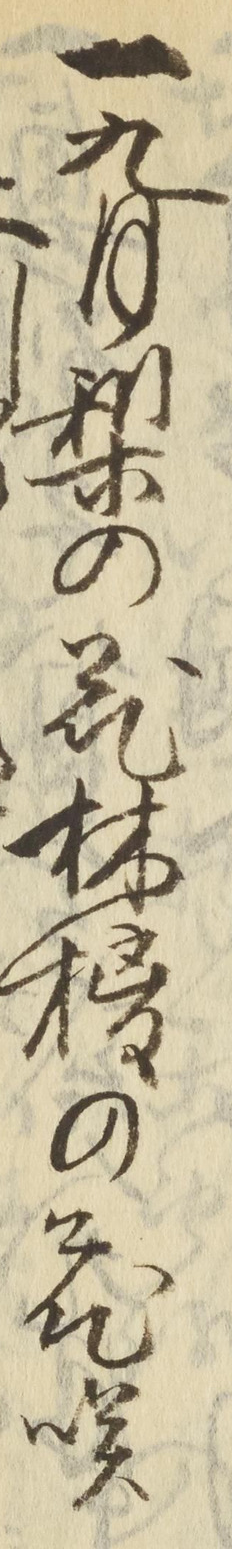一九月梨の花林檎の花咲
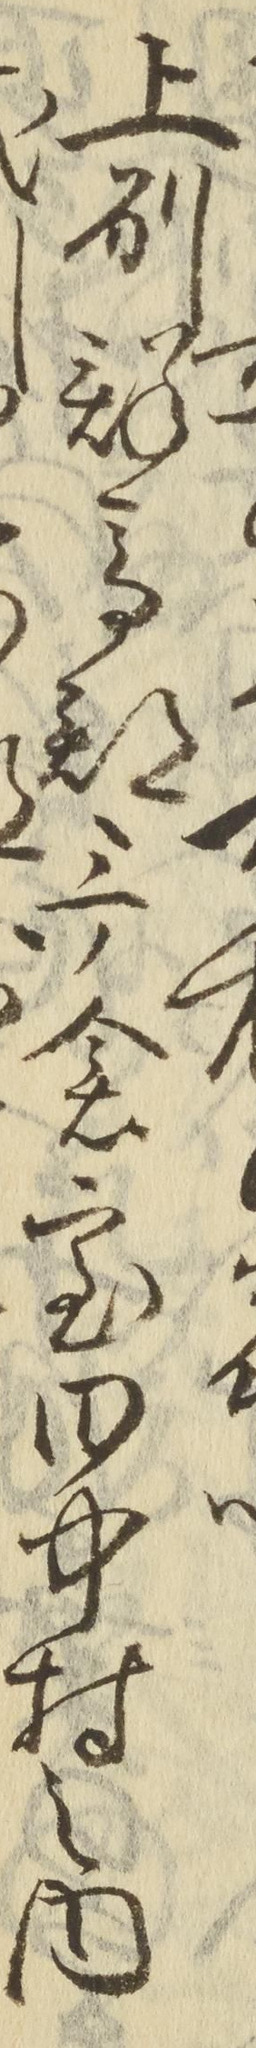上州郡馬郡三ノ倉室田中村の内
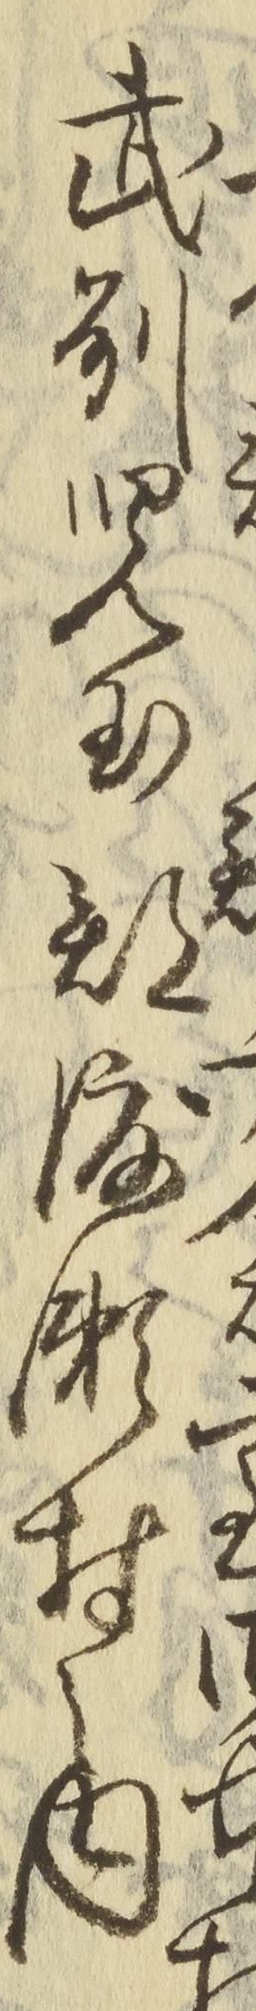武州児玉郡渡瀬村ノ内

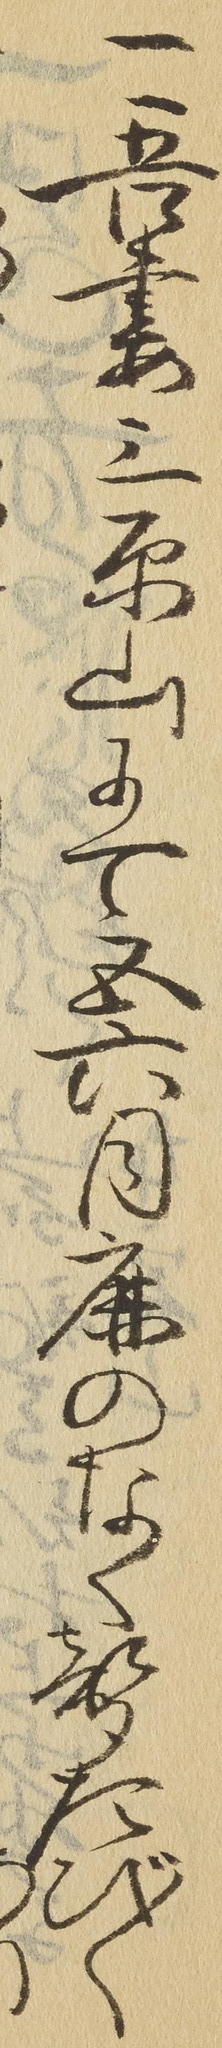一吾妻三原山にて五六月鹿なく声たび〳〵あり
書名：浅間大變記
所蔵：東京大学地震研究所図書室 Earthquake Research Institute Library, The University of Tokyo, JAPAN
